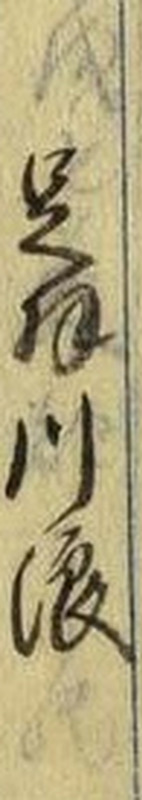足羽川浪
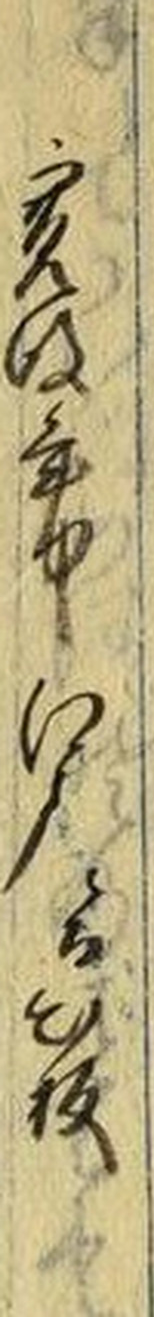寛政年中江戸ニ而出板
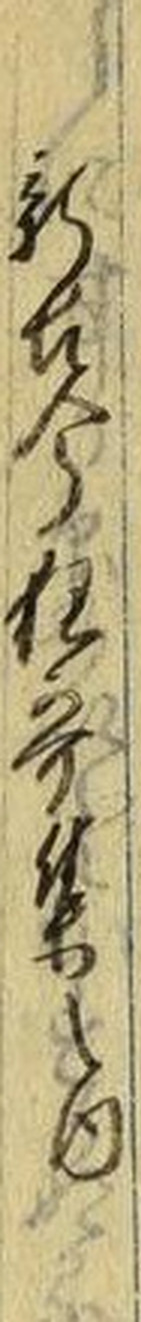新古今狂歌集之内
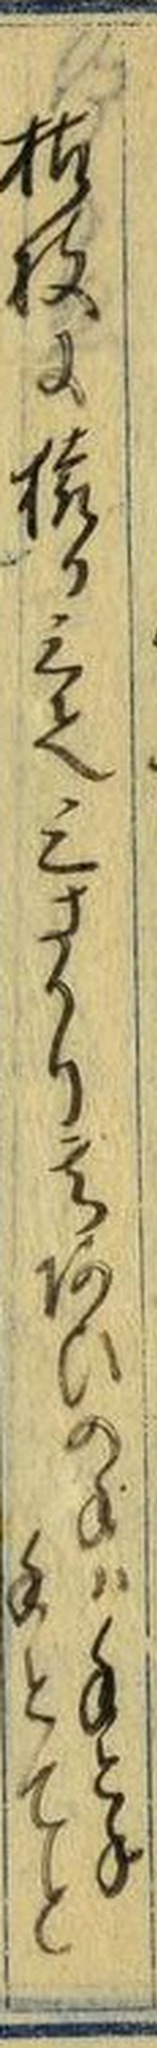枯枝に猿か三疋三さかり其あひの手は手と手手とてと
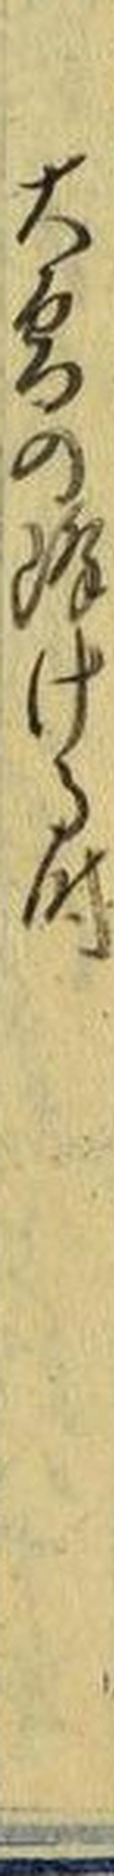大雪の降ける時
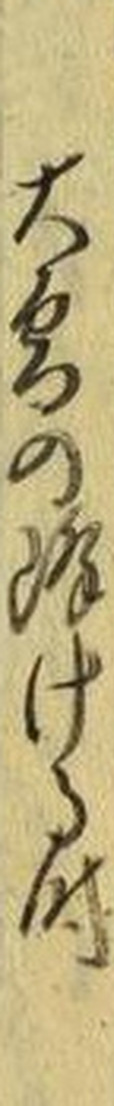大雪の降ける時
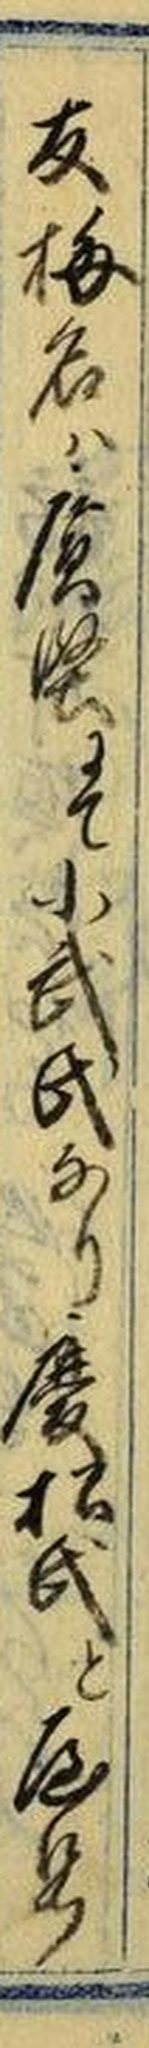友梅名は廣堅にて小武氏なり慶松氏と屋号
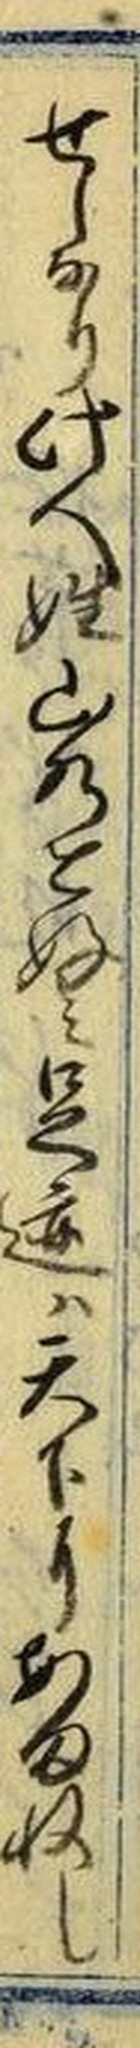せしなり此人姓山水を好み足迹は天下にあまねし
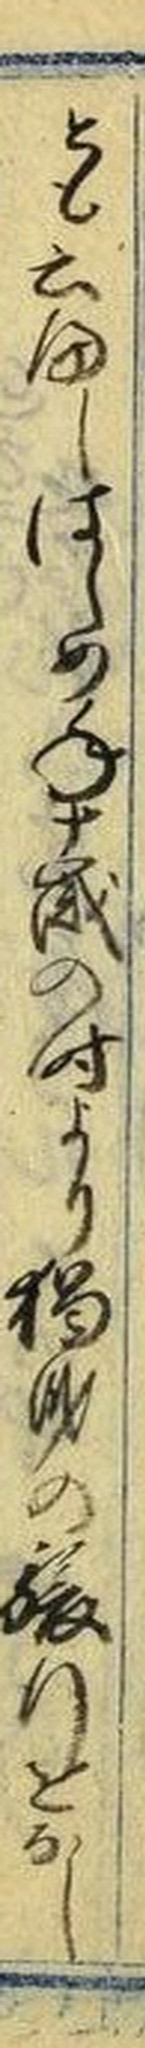とも云へしはしめ年十歳の時より獨身の旅行をなし
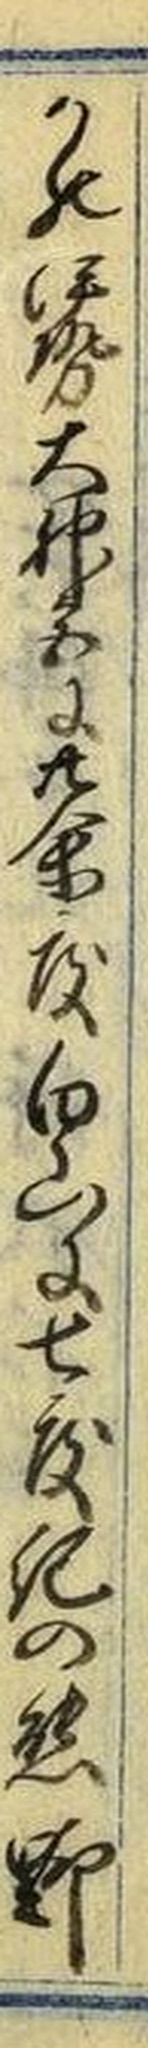かの伊勢大神宮に廿余度白山に七度紀の熊野
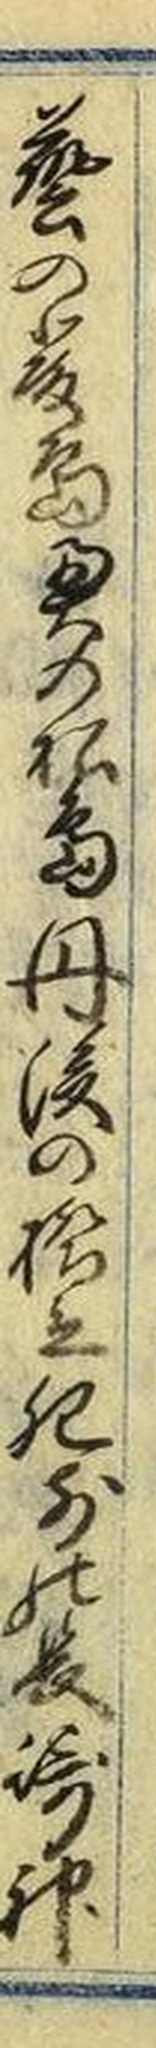藝の厳島奥の松島丹後の橋立肥前の長崎神
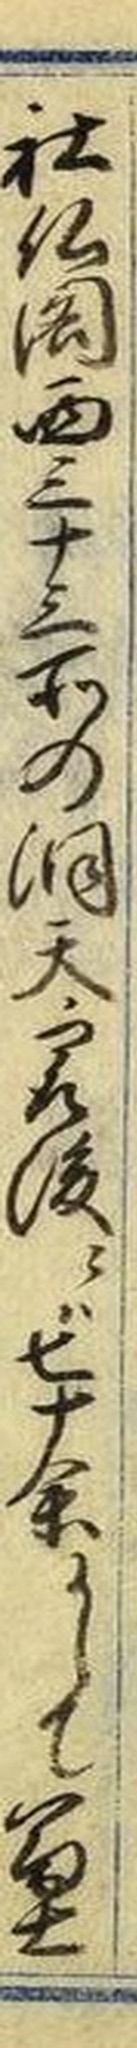社仏閣西三十三所の洞天最後には七十余にして冨士
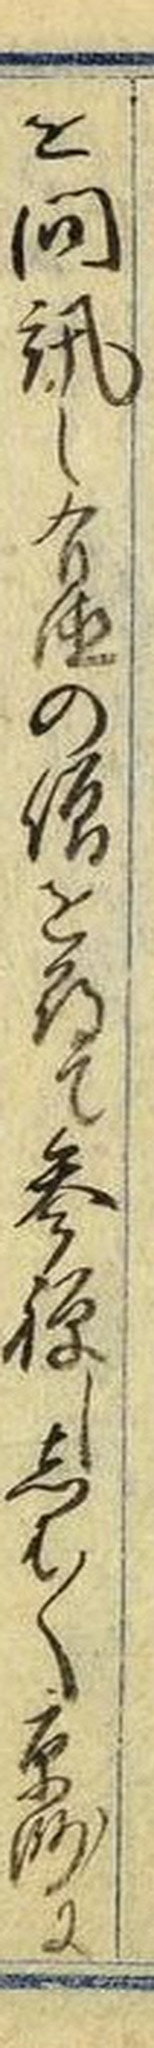を問訊し有徳の僧を尋て参禅ししは〳〵京師に
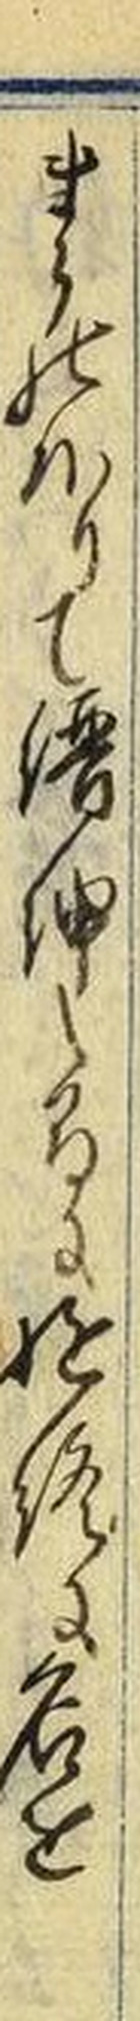まうのほりて縉紳之間に遊終に名を
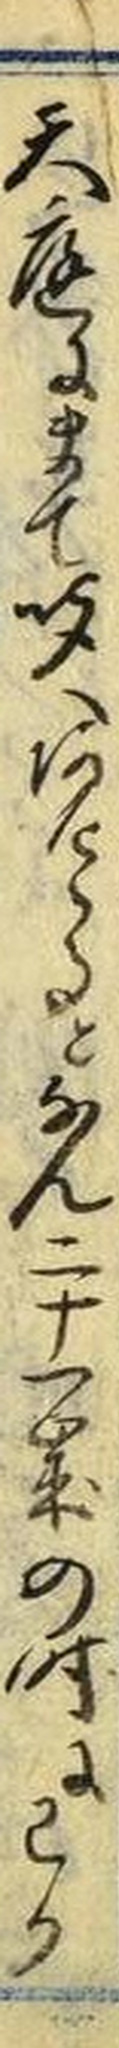天庭にまて聞へあけゝるとなん二十一歳の時にわか

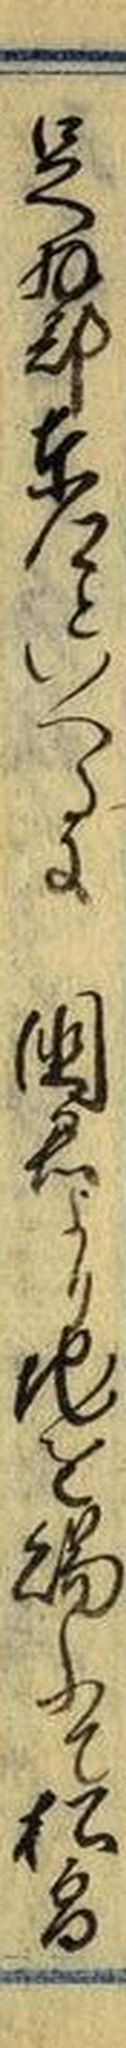足羽郡東郷といへるに国君より地を給ふて松雪
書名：温古集 三巻
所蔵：福井県文書館 Fukui Prefectural Archives
